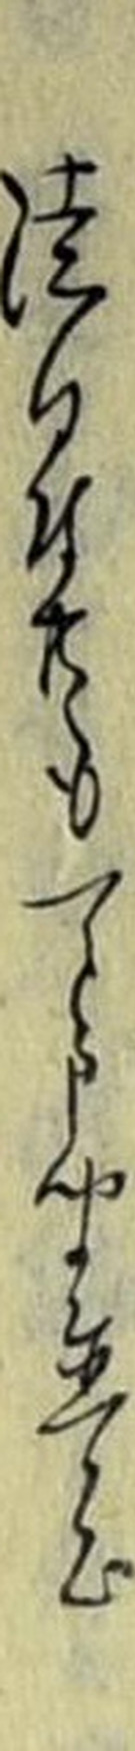徒目付共へも可被申聞置以上
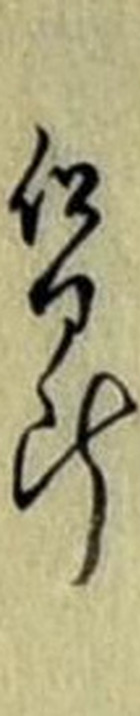但同断
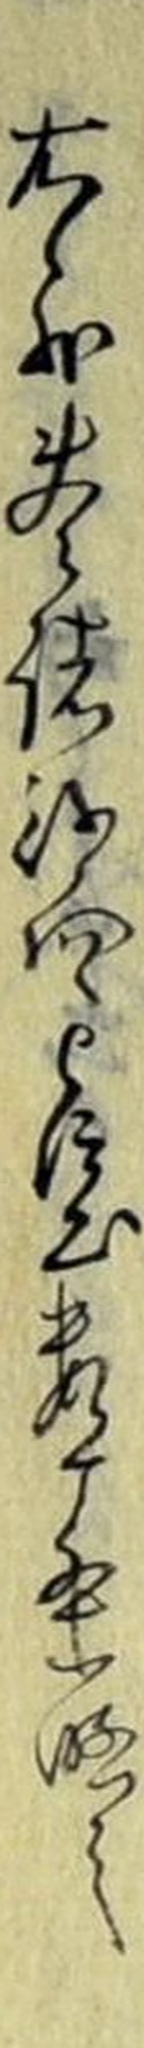右之外夫々諸役向へ被仰出数ヶ条略之

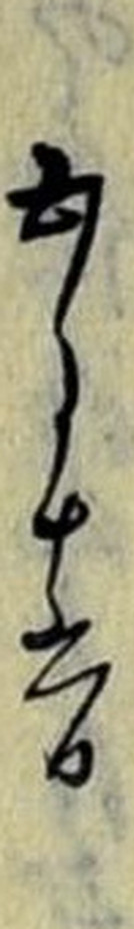五月十六日
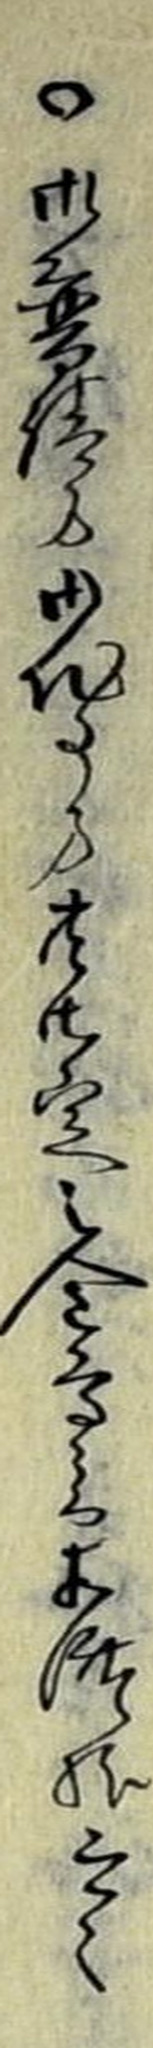〇御普請方御作事方共御定之金高に而相済候様云々
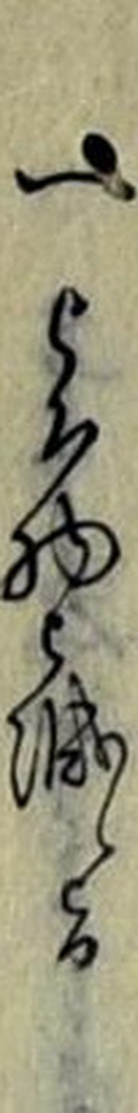一被下物被減候旨
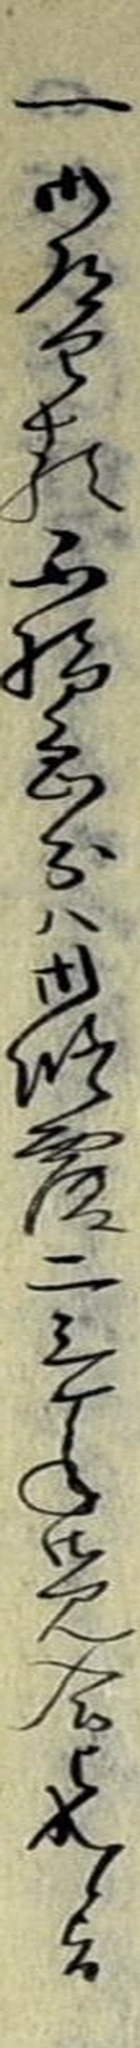一御道具類不指急分は御修覆二三ヶ年御見合被成候旨
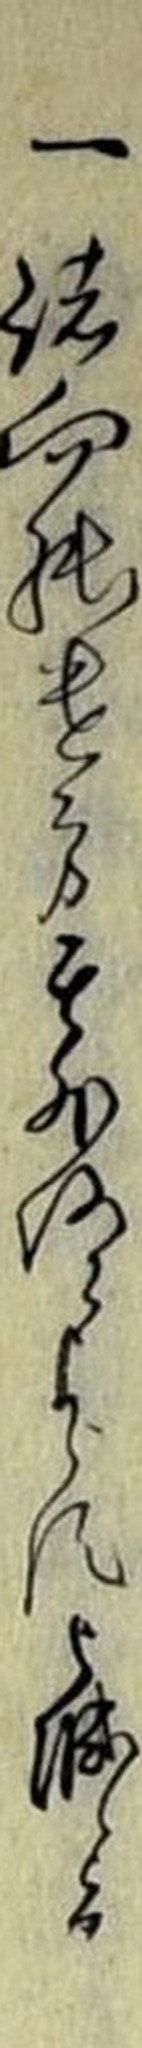一諸向紙遣方其外何によらす被減候旨
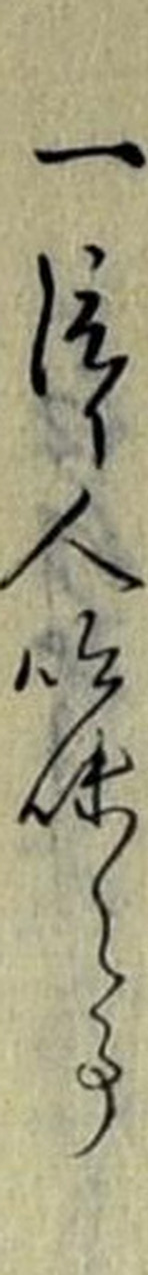一渡り人吟味之事
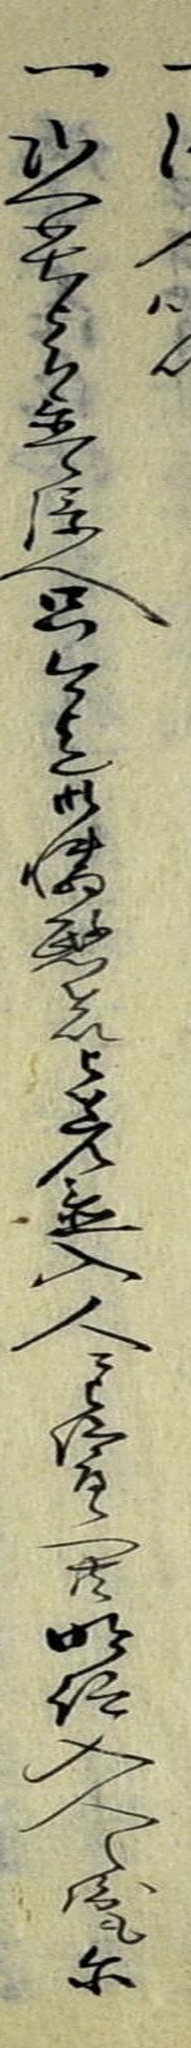一弐人ふち被下置候浮人只今迄御憐愍を以被差置入人に被仰付候へ共明跡入人之儀も尓
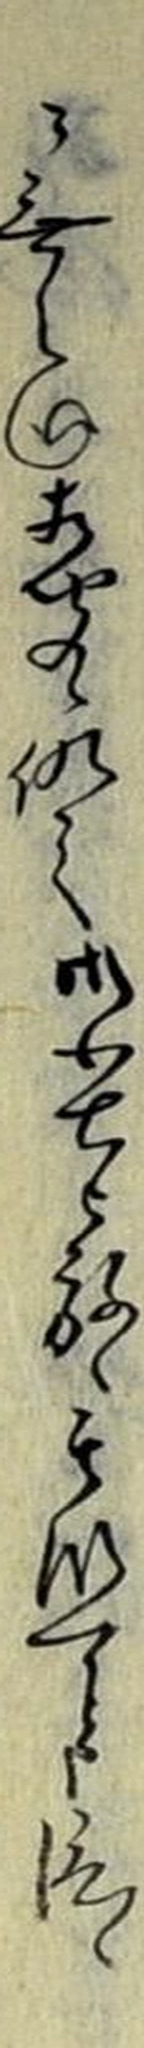々無之趣相聞候仍之御ふち被放候其段可被申渡候
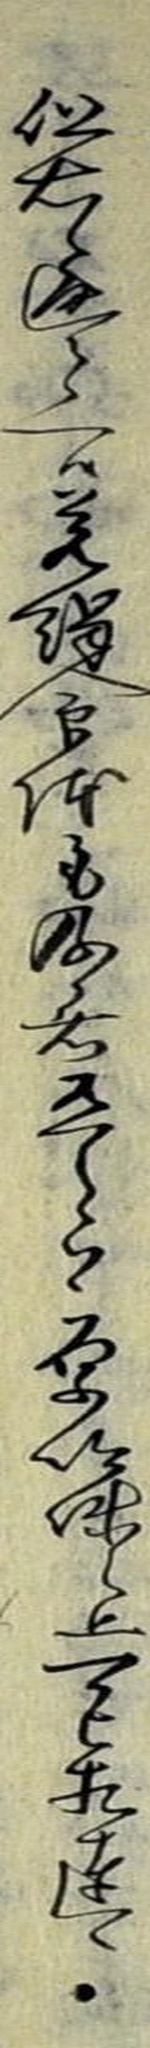但右之通に候へは若触命体にも及候者有之候はゝ厚吟味之上可被相達候
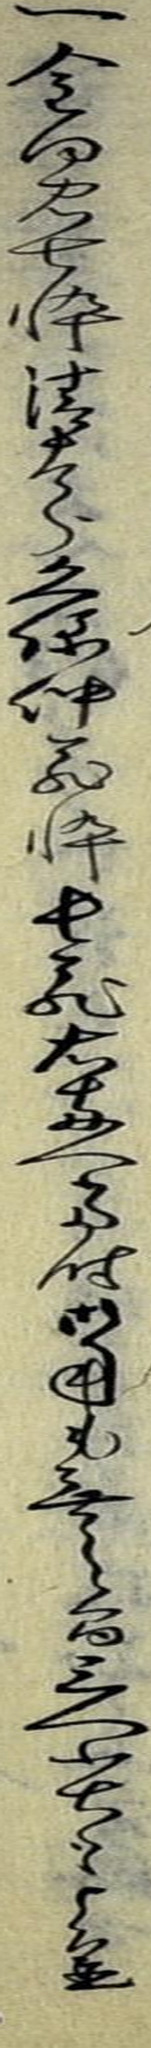一金田忠七忰清太郎久保仲蔵忰長蔵右両人当時御用も無之候間三人ふちも被下置
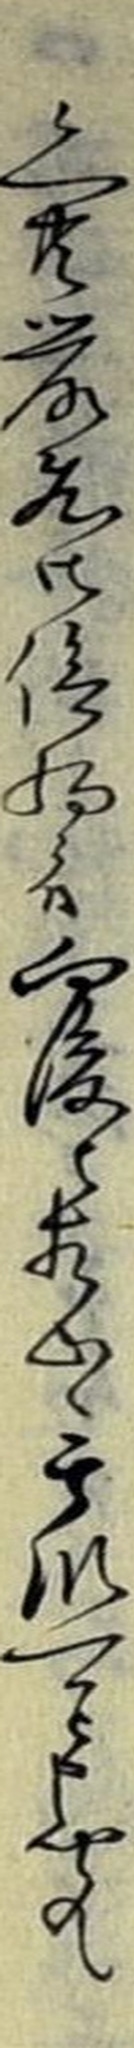候へ共厳敷御倹約に付向後被相止候其段可被申聞候
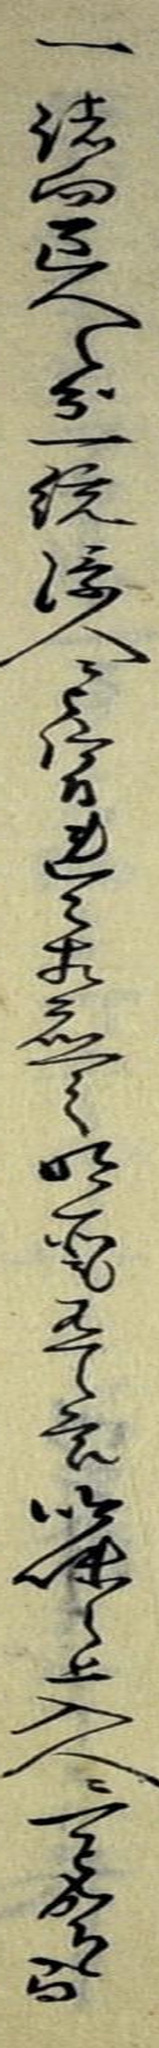一諸向過人之分一統浮人に被仰付連々相応之明所も有之節吟味之上入人に可被成下候間
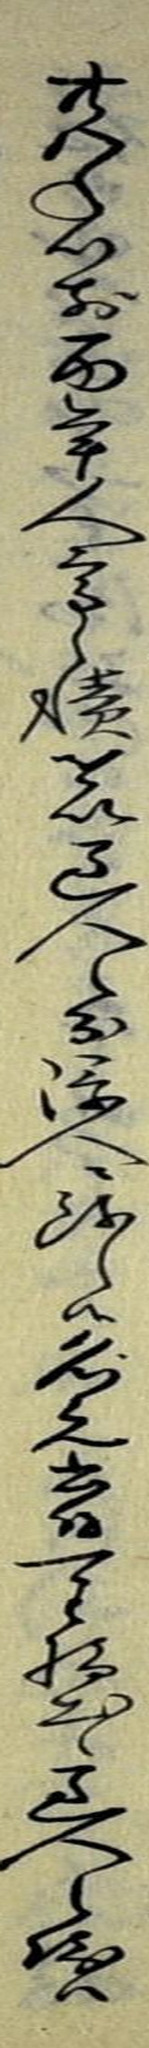廿八年以前酉年人高之積を以過人之分浮人に致候名元書付可被指出候過人之儀は
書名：命令之部 二
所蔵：福井県文書館 Fukui Prefectural Archives
